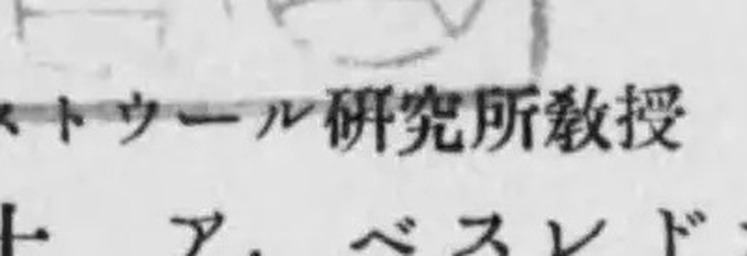パストウール研究所教授
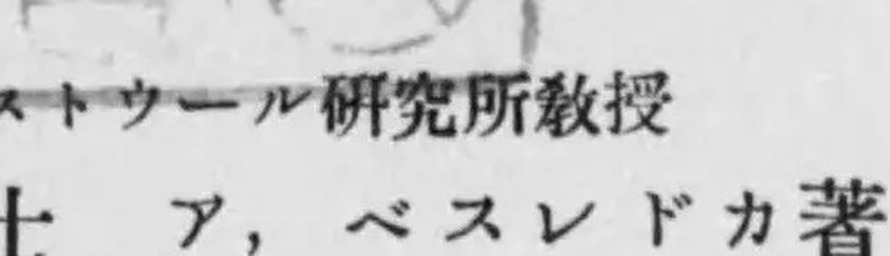パストウール研究所教授
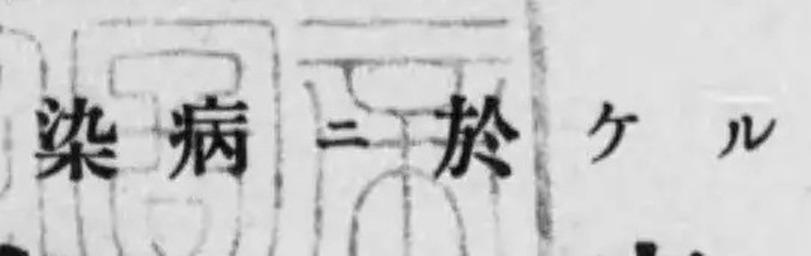傳染病ニ於ケル
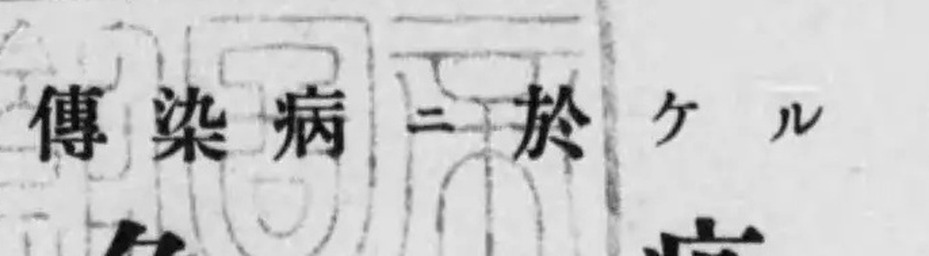傳染病ニ於ケル
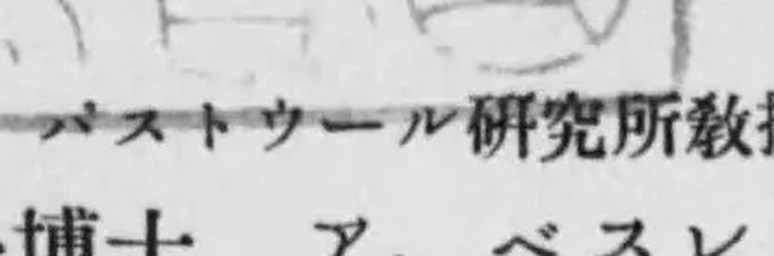パストウール研究所教授
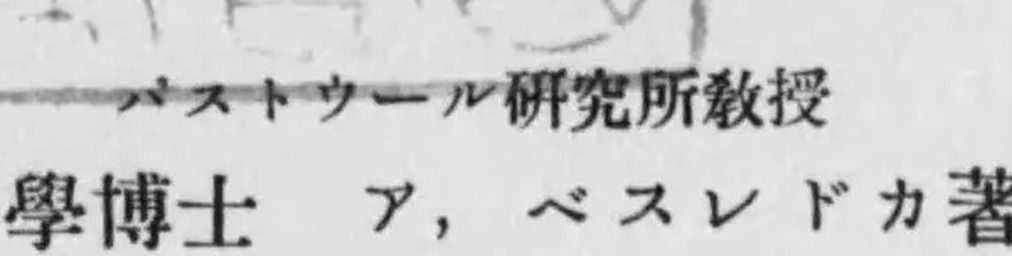パストウール研究所教授
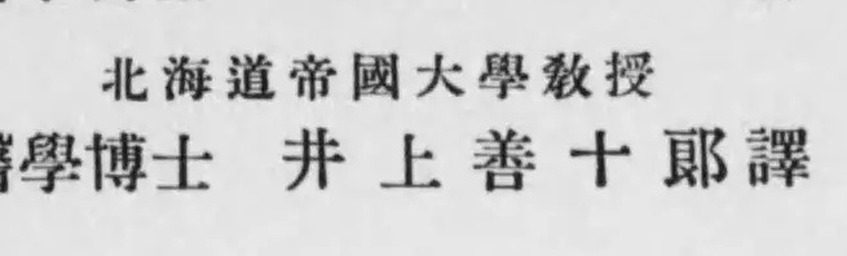醫學博士井上善十郎譯

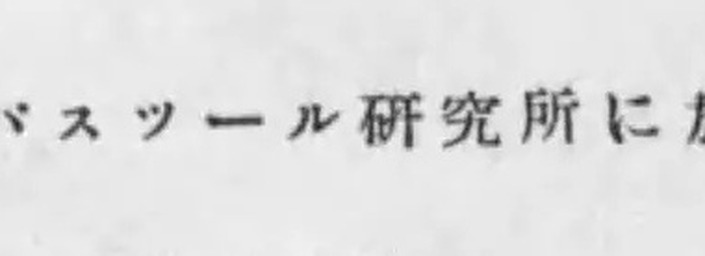巴里パスツール研究所
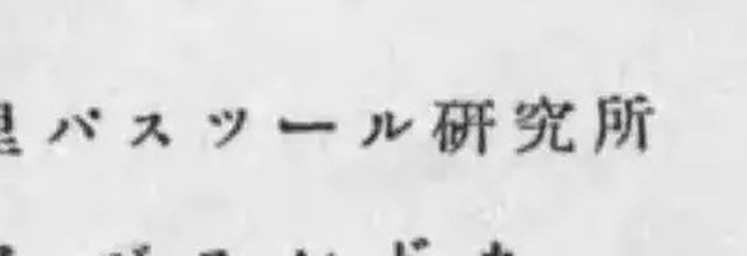巴里パスツール研究所
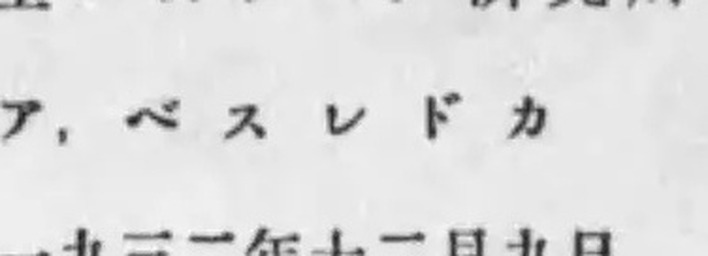ア，べスレドカ
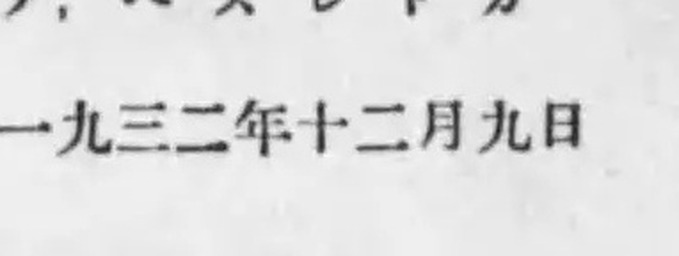一九三二年十二月九日
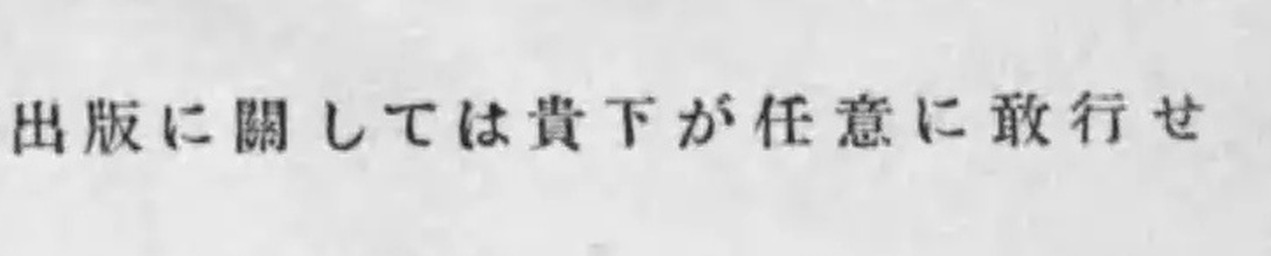従つて貴下が日本譯御出版に關しては貴下が任意に敢行せ
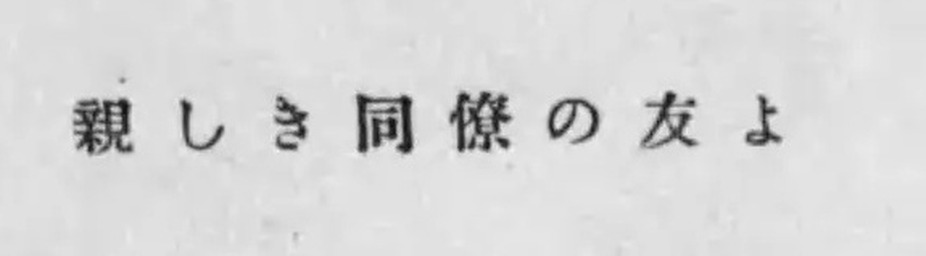親しき同僚の友よ
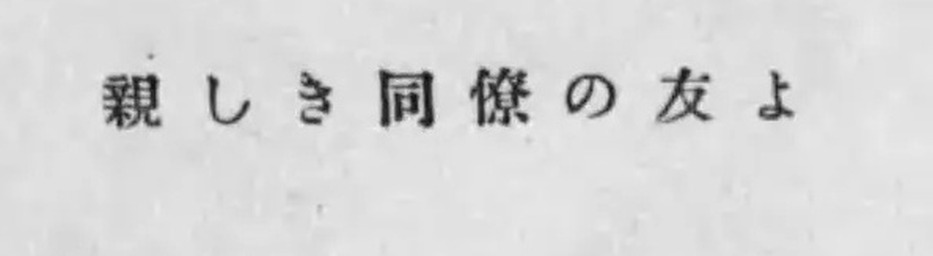親しき同僚の友よ
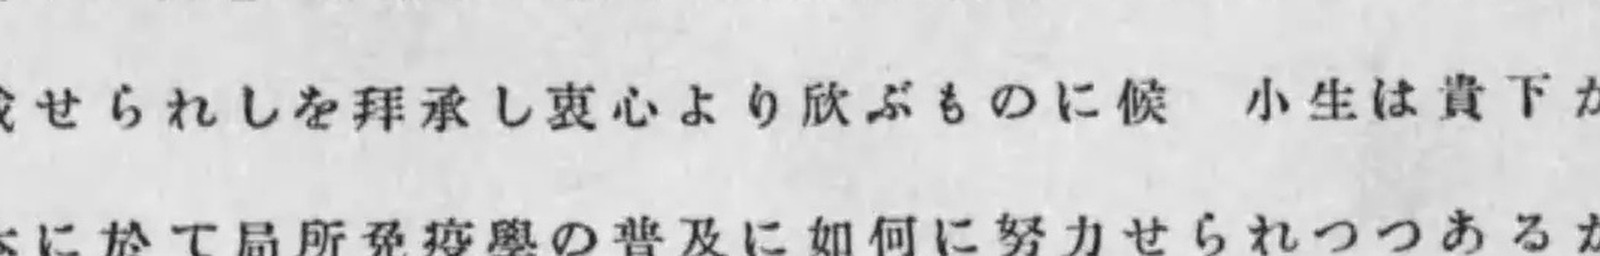完成せられしを拝承し衷心より欣ぶものに候小生は貴下が
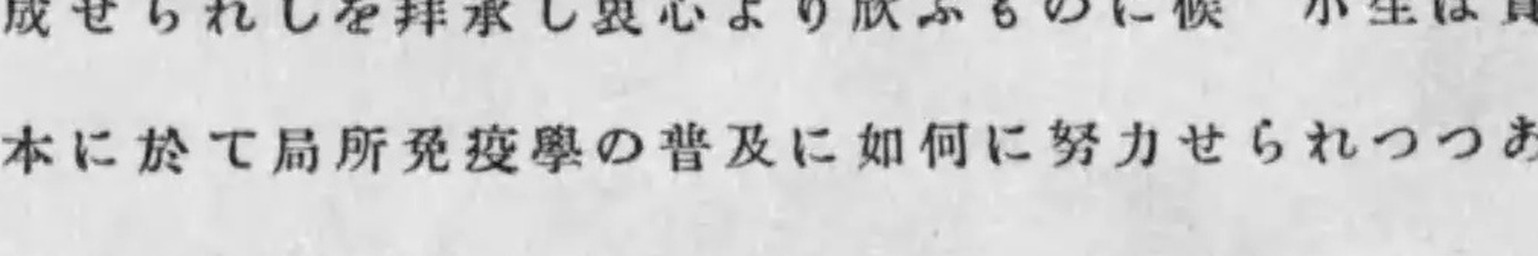日本に於て局所免疫學の普及に如何に努力せられつつあるか
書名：伝染病ニ於ケル免疫ニ関スル研究
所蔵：国立国会図書館 National Diet Library, JAPAN
